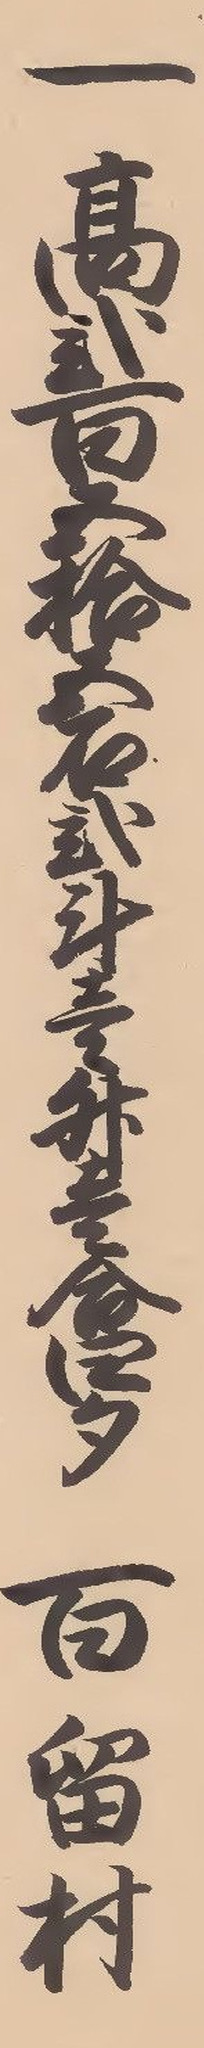一髙弐百五拾五石弐斗壱升壱合四夕百留村
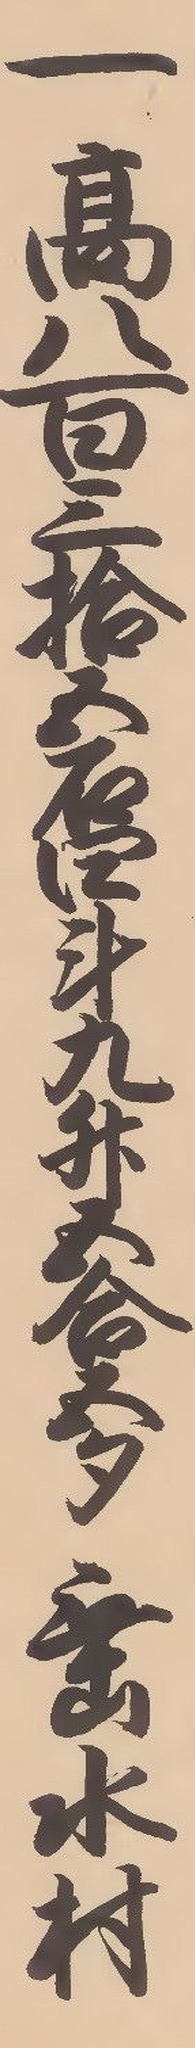一髙八百三拾五石四斗九升五合五夕垂水村
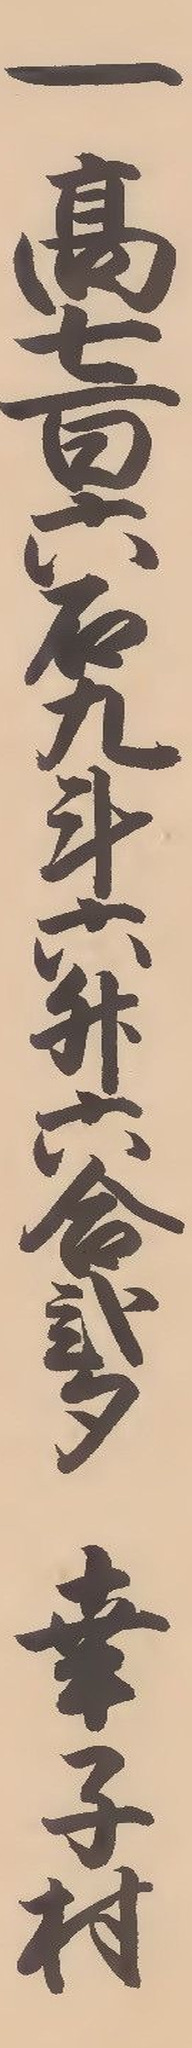一高七百六石九斗六升六合弐夕幸子村
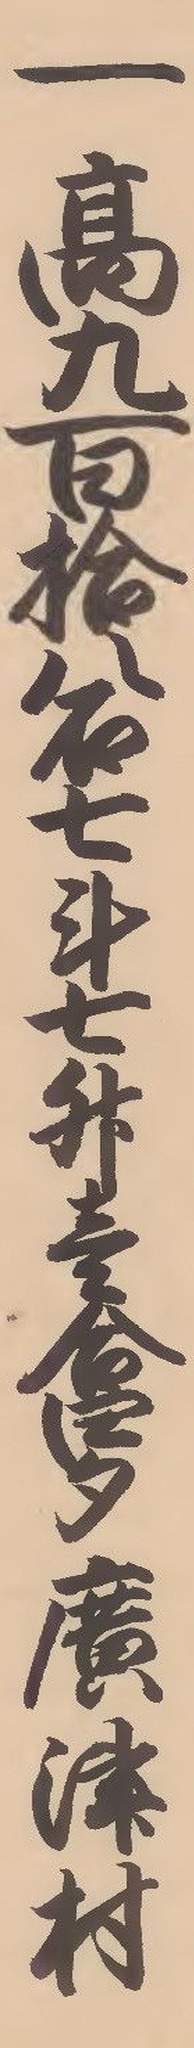一髙九百拾八石七斗七升壱合四夕廣津村
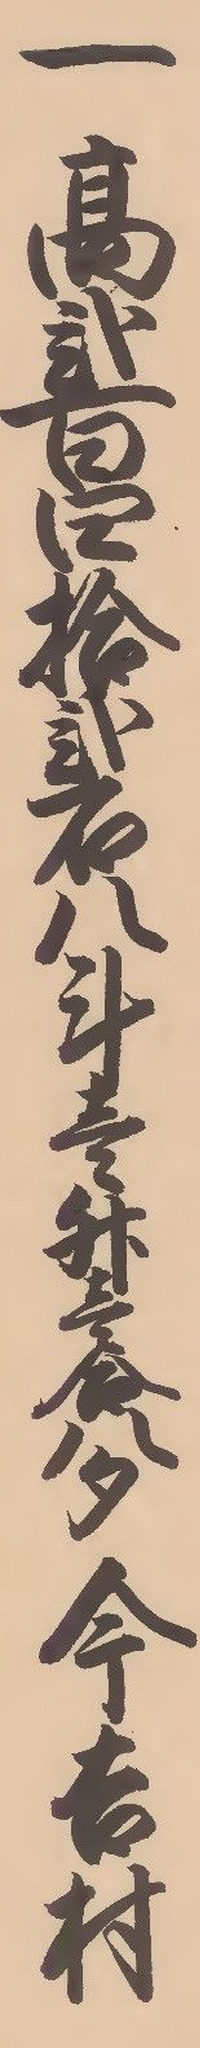一髙弐百四拾弐石八斗壱升壱合八夕今吉村

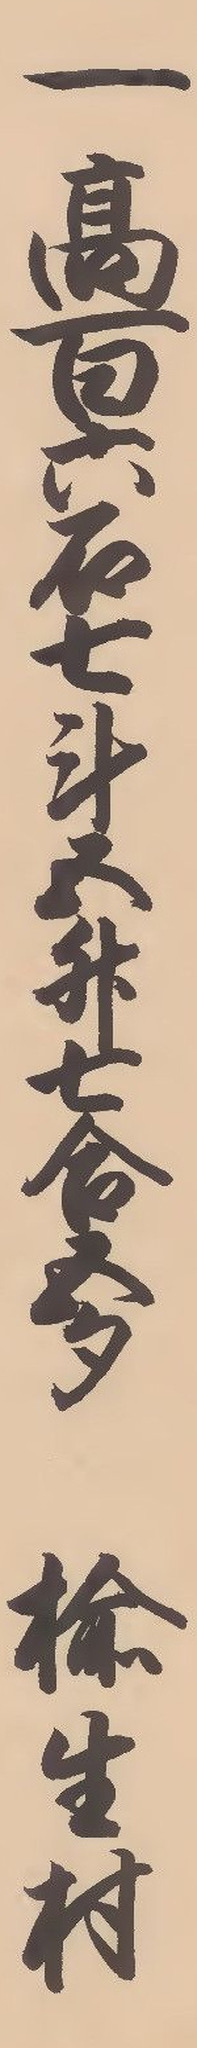一髙百六石七斗五升七合五夕楡生村
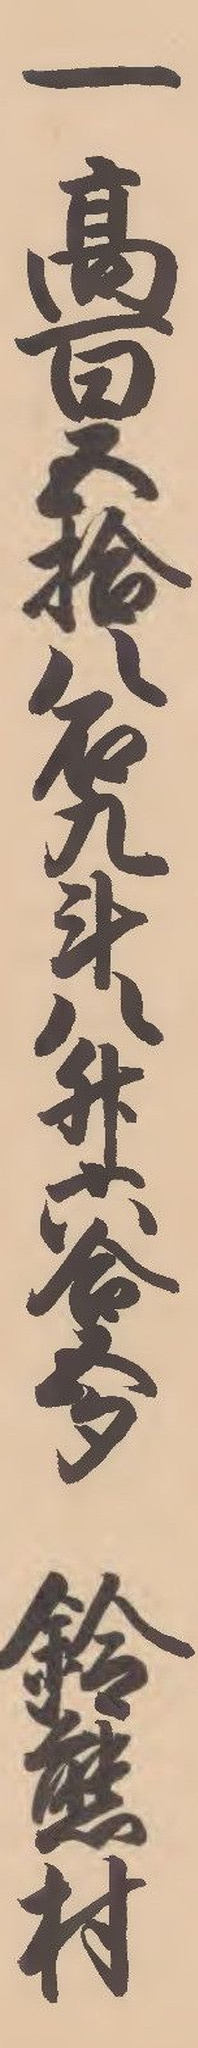一高百五拾八石九斗八升六合五夕鈴熊村
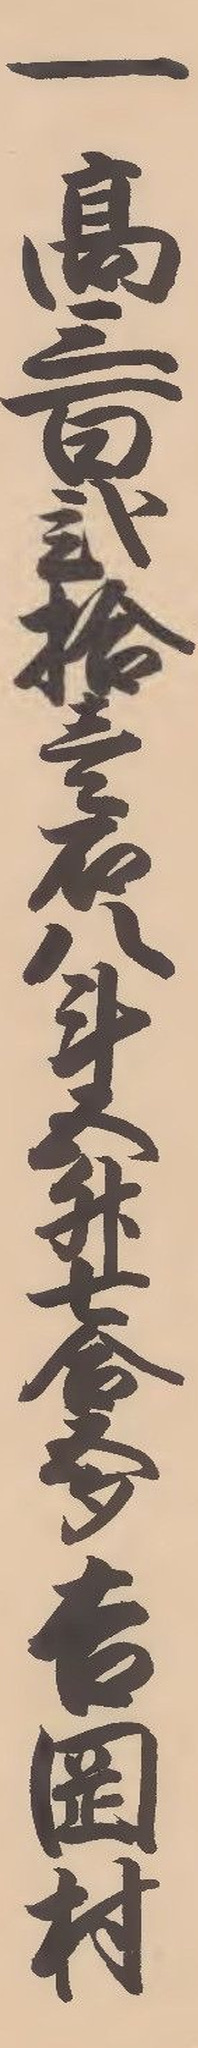一髙三百弐拾壱石八斗五升七合五夕吉岡村
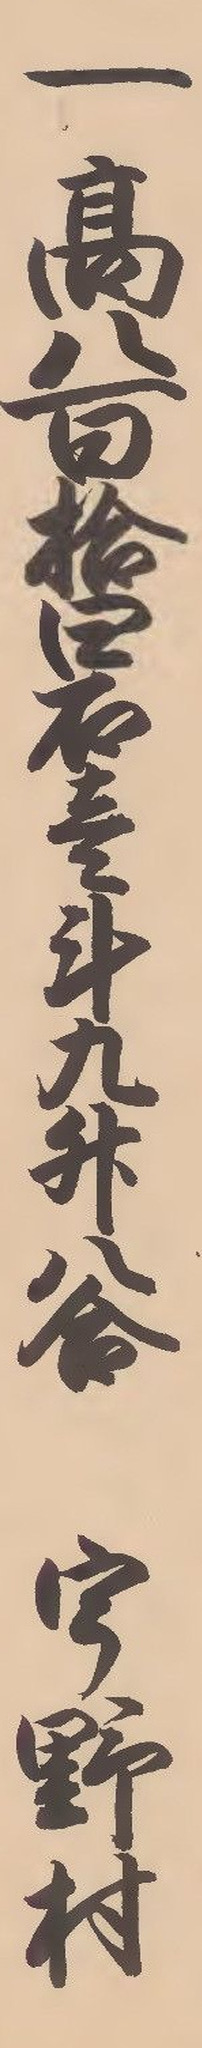一髙八百拾四石壱斗九斗八升宇野村
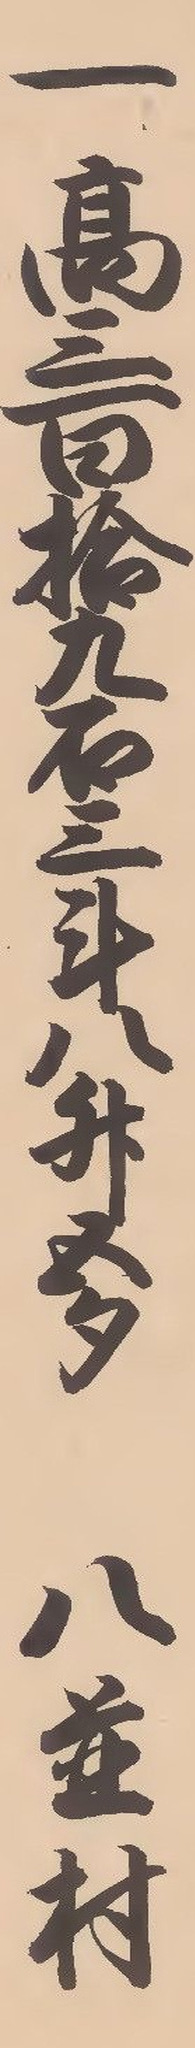一髙三百拾九石三斗八升五夕八並村
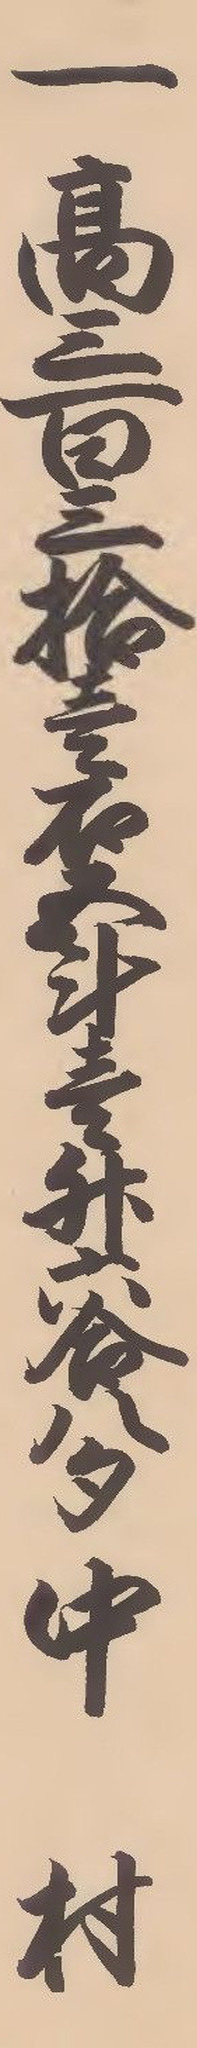一髙三百三拾壱石五斗壱升六合八夕中村
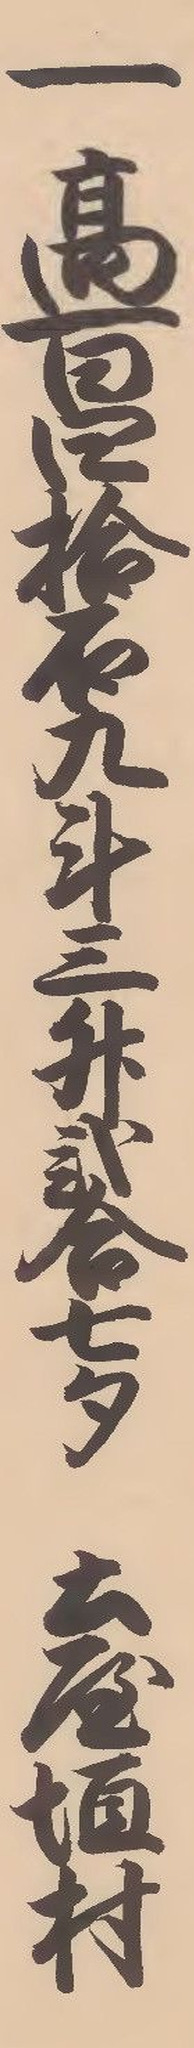一高百四拾石九斗三升弐合七夕土屋垣村
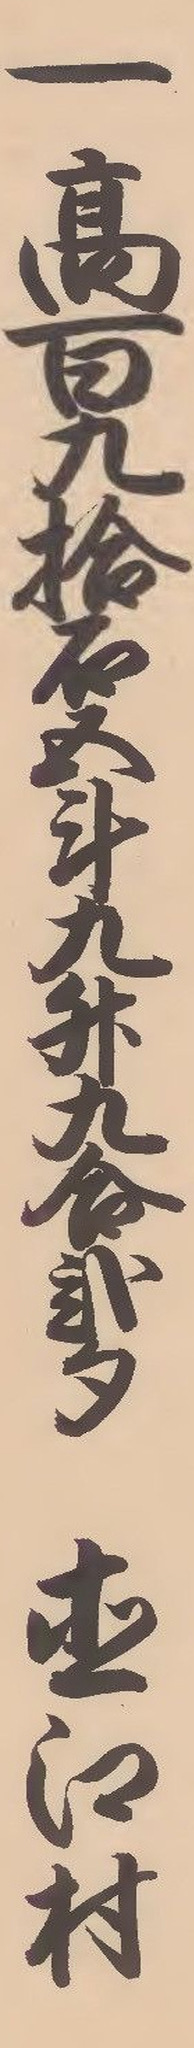一髙百九拾石五斗九升九合弐夕直江村

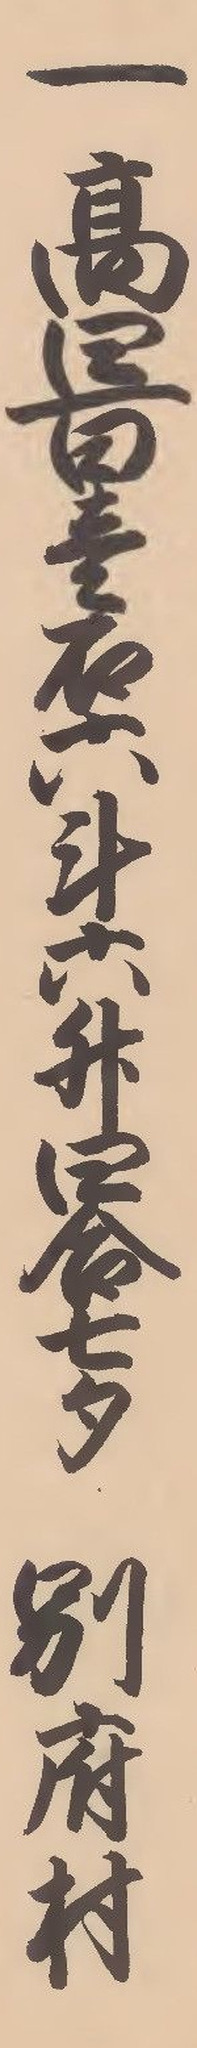一髙四百壱石六斗六升四合七夕別府村
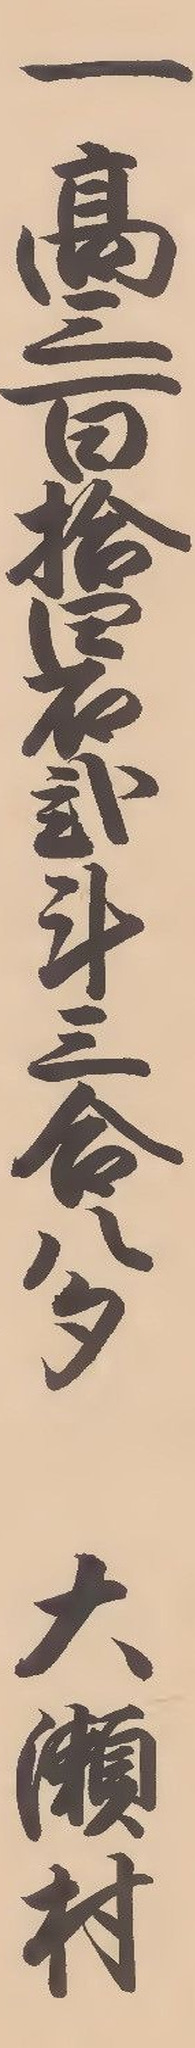一髙三百拾四石弐斗三合八夕大瀬村
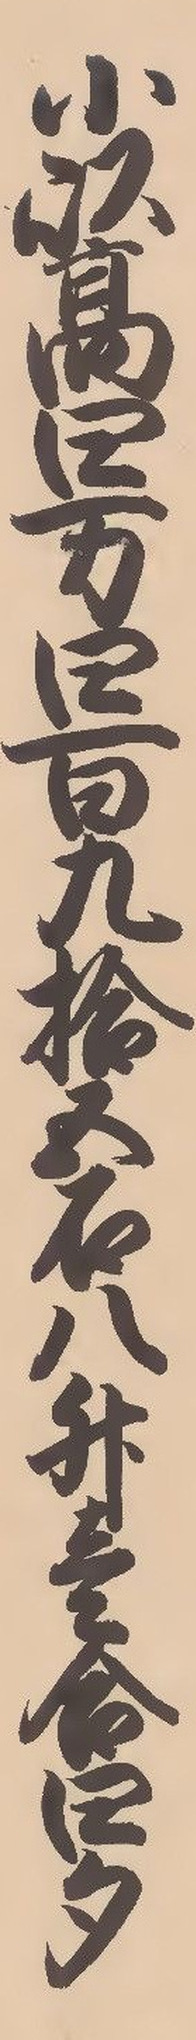小以髙四万四百九拾五石八升壱合四夕
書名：豊前国郷帳
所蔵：国立公文書館 National Archives of Japan
